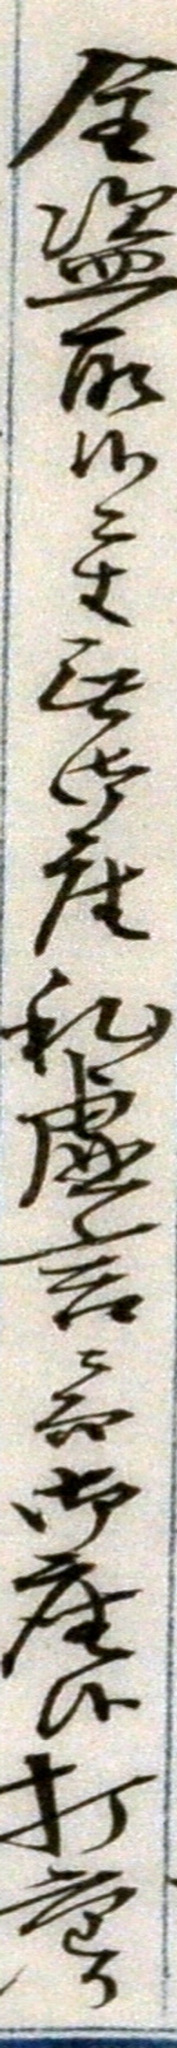全盗取候ニ者無御座私虚言ニ而御座候打重り
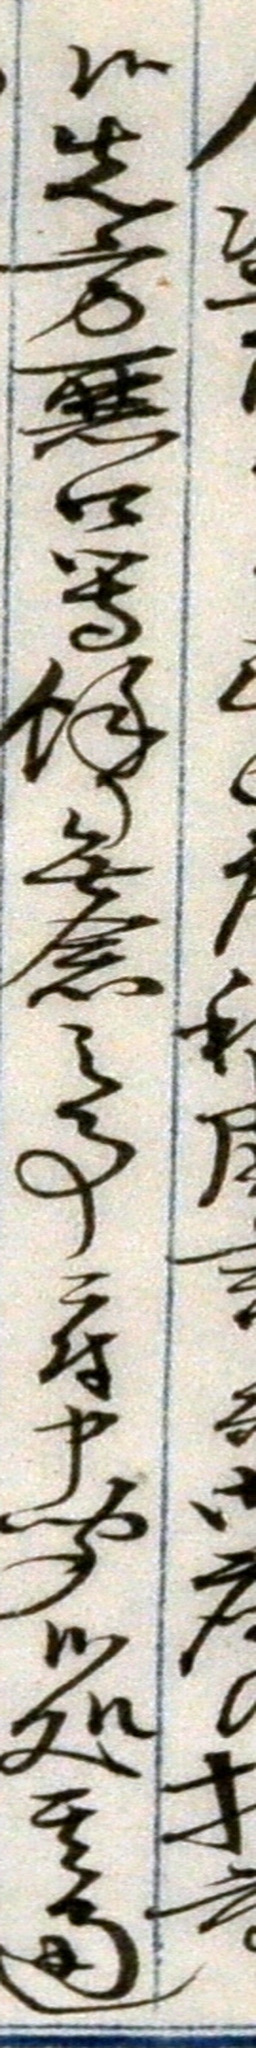候先方悪口餘り無念之事ニ付申聞候処其通
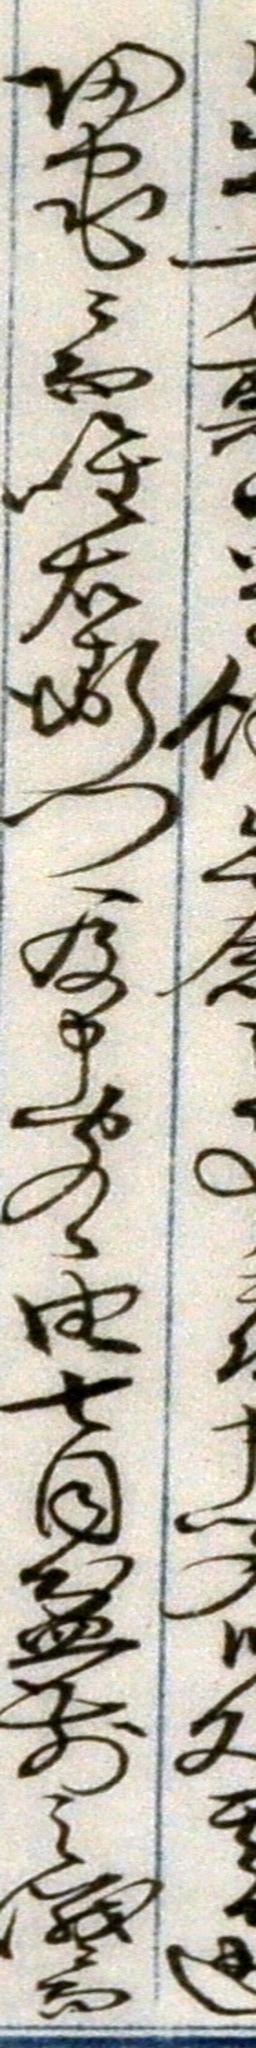帰宅ニ而唯右衛門へ及申聞候由七月盆前之儀ニ而
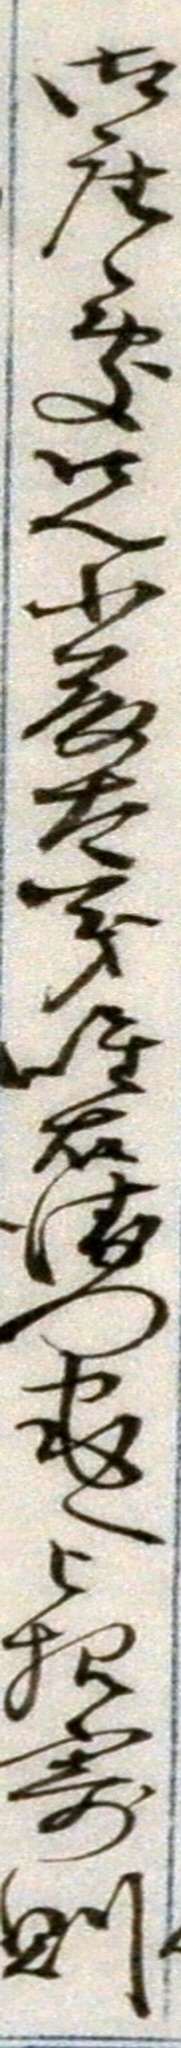御座候處兄小藤太義唯右衛門宅へ被招寄則
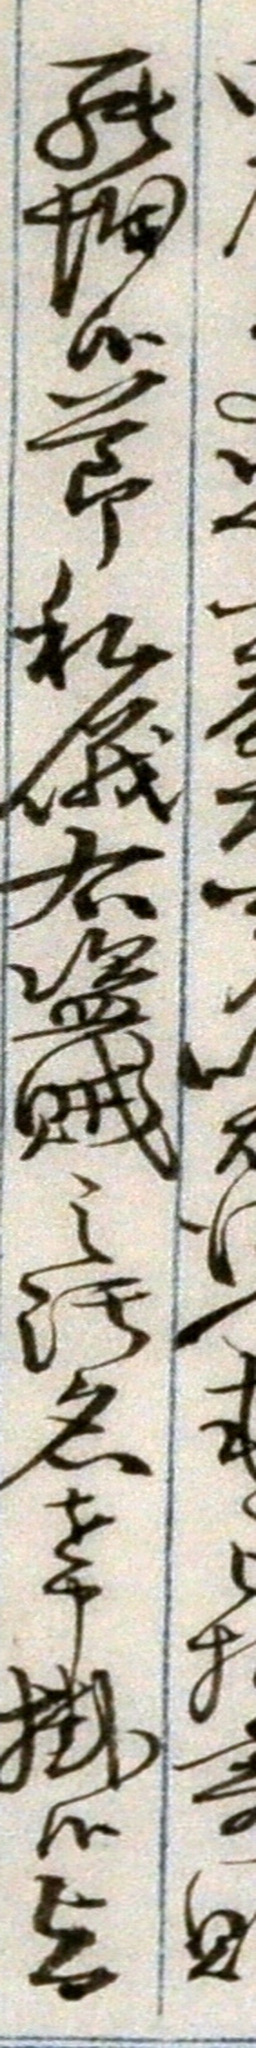罷越候節私儀右盗賊之汚名を申掛候旨
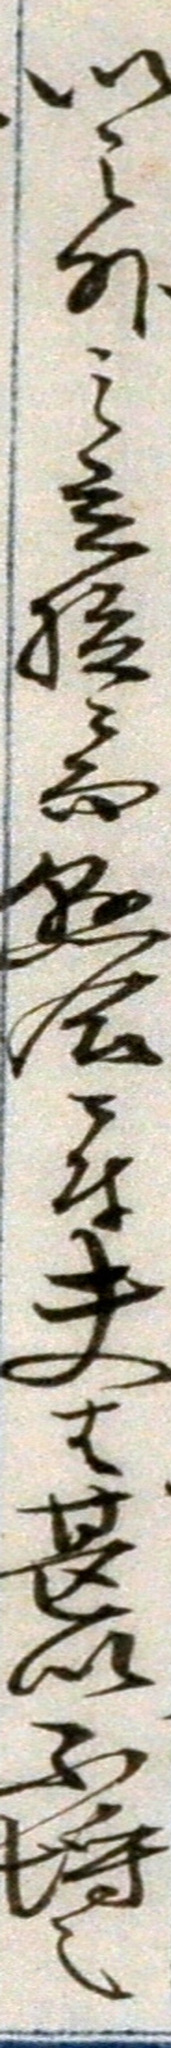以之外之立腹ニ而懸合ニ付夫者甚以不埒之
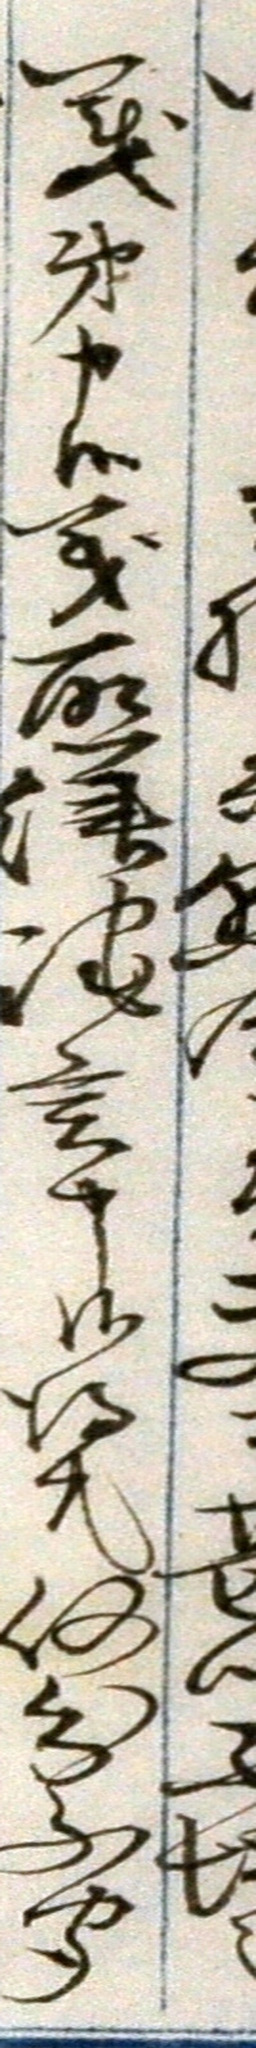義弟申候義取繕詫言申候得共何分不聞

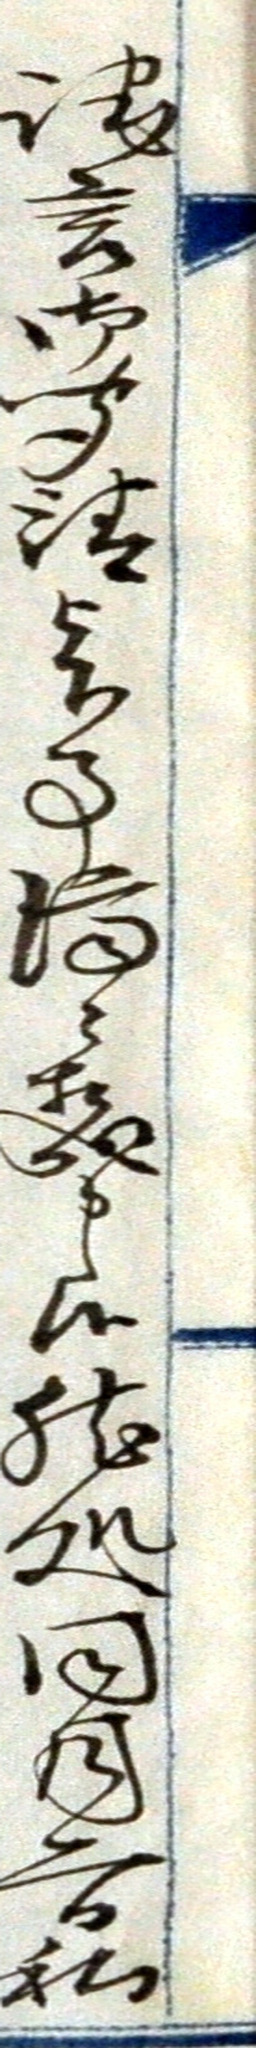詫言御聞請被下事済ニ相成申候然処同月二日私
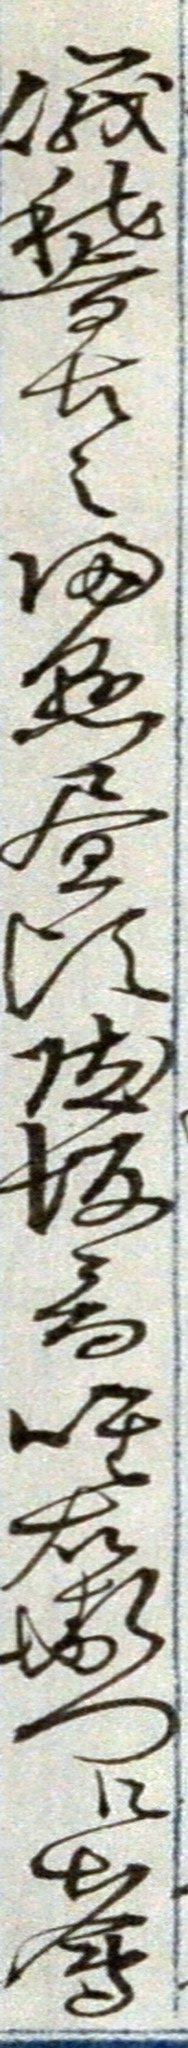儀稽古之帰懸昼頃殿坂ニ而唯右衛門に出会
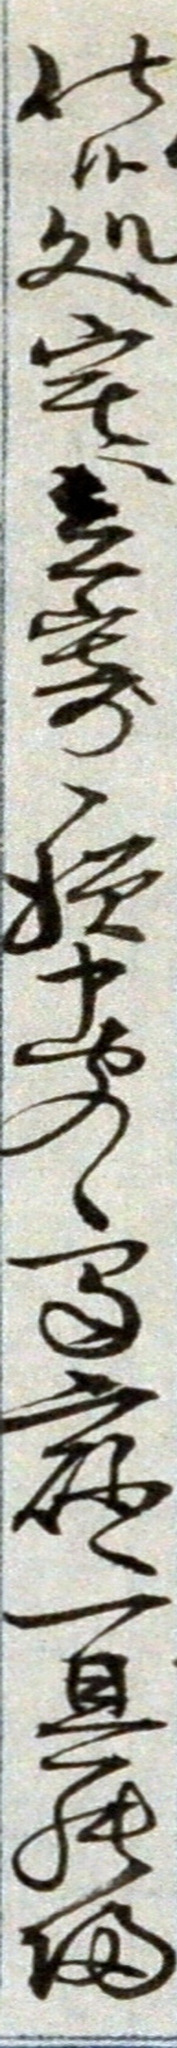仕候処宅へ立寄候様申聞候間宿へ一旦罷帰
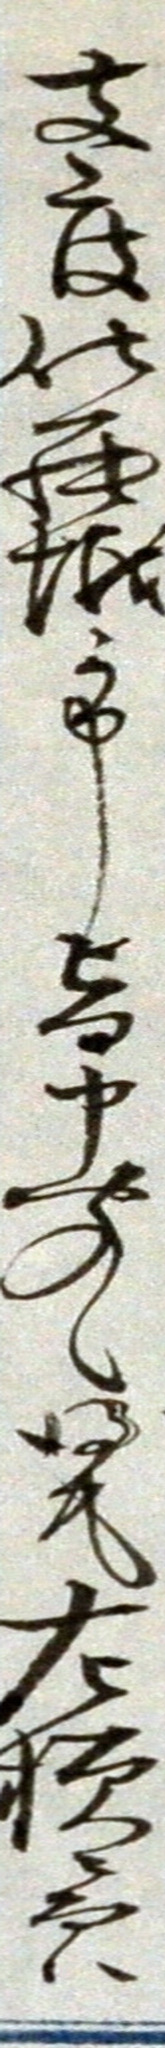支度仕罷越可申旨申聞候得共左様ニ而ハ
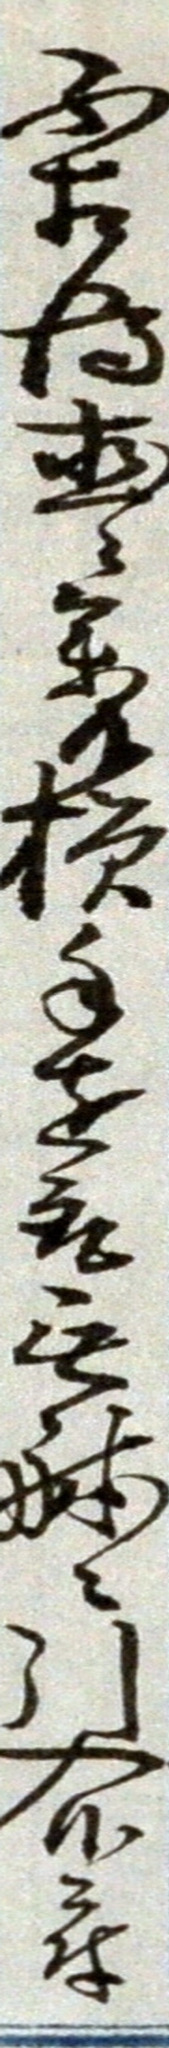不相済直ニ参ル様手を取無躰ニ引入候ニ付
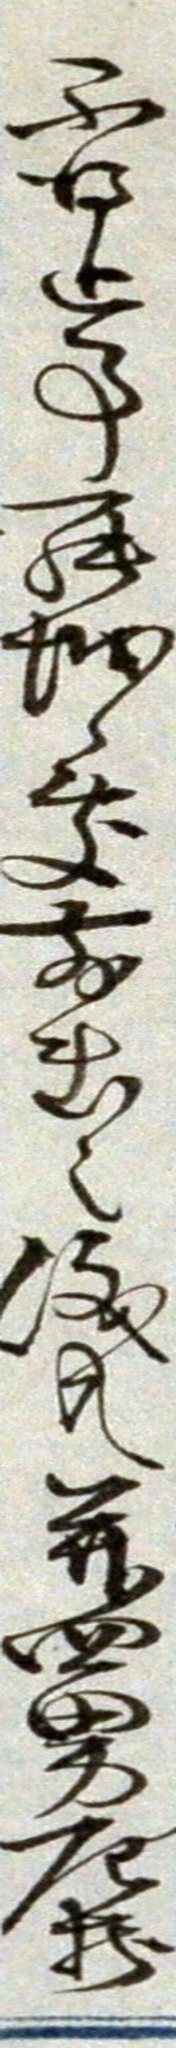不得止事罷越候處前書之儀共幷四男辰蔵
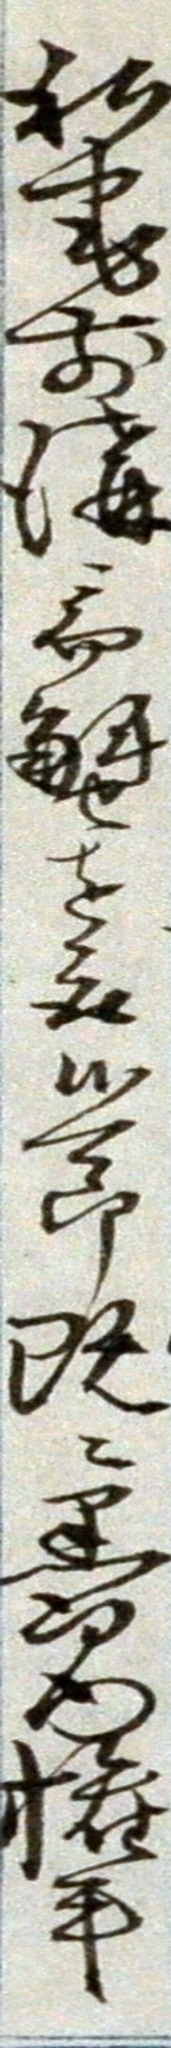私宅前溝ニ而蟹を取候節既ニ黒河内權平
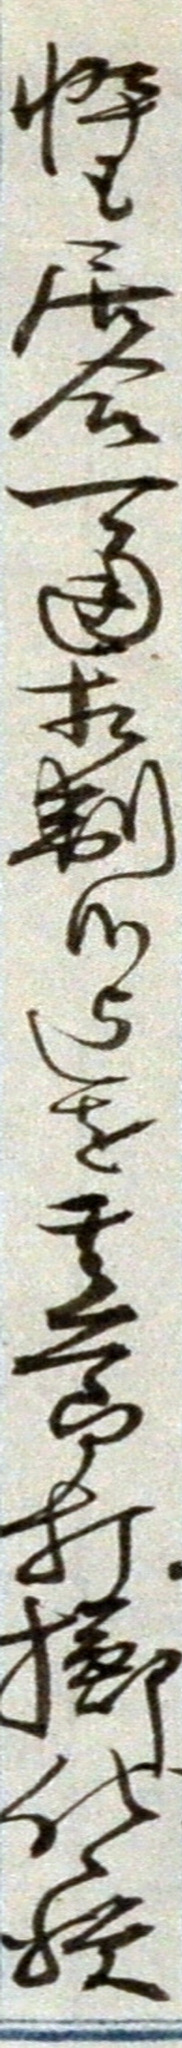忰も居合一通相制候迄を其節打擲仕候様
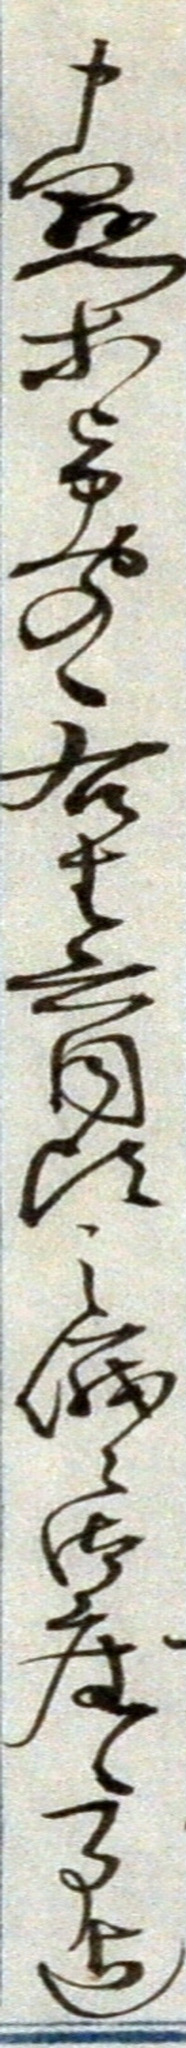申懸抔被申聞候右者六月頃之儀ニ御座候事迄
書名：川面小藤太子細有之多賀谷唯右衛門ヲ打果候一件
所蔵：伊那市立高遠町図書館・合同会社AMANE
